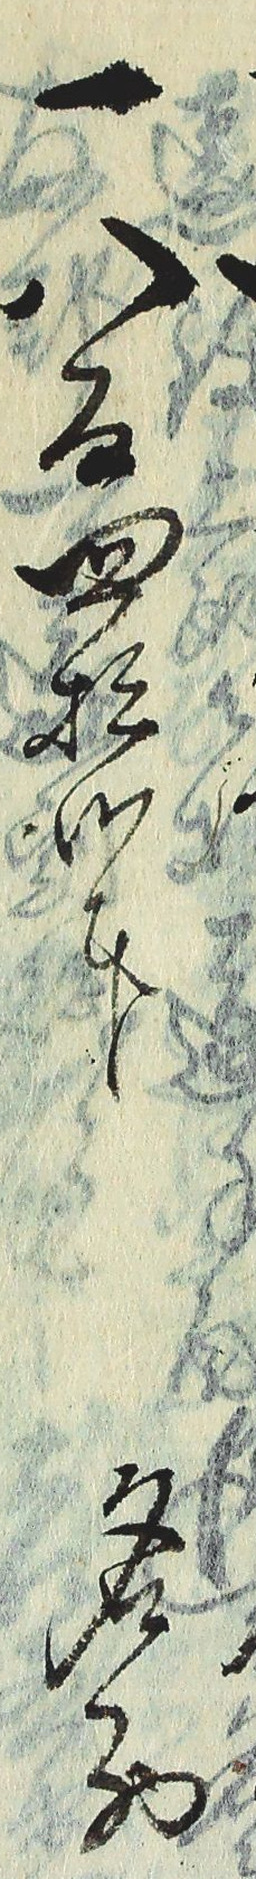一八百四拾弐本名西
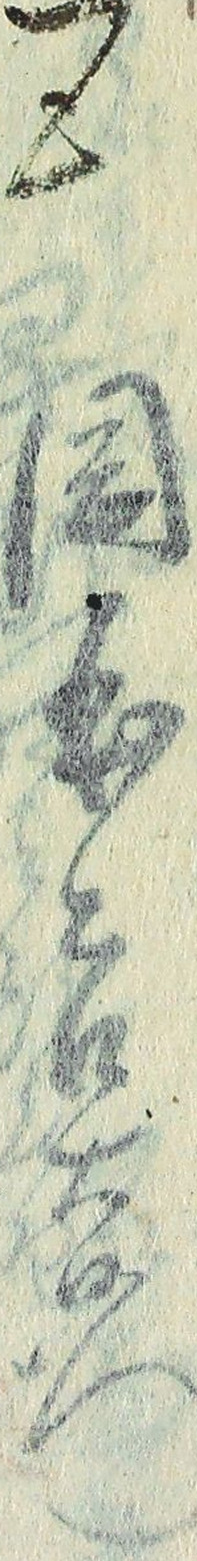岡本吉右衛門
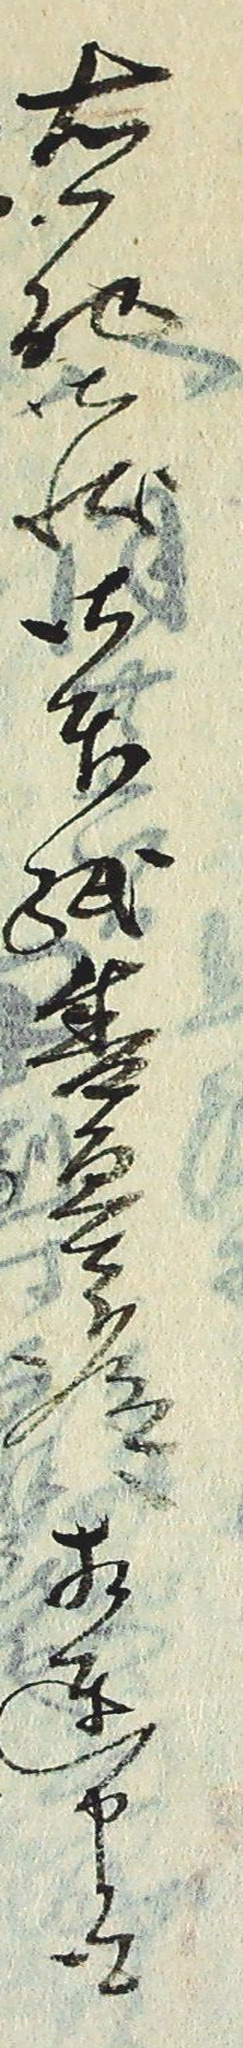右御配御状御本紙盛宣七郎殿へ相達申候以上
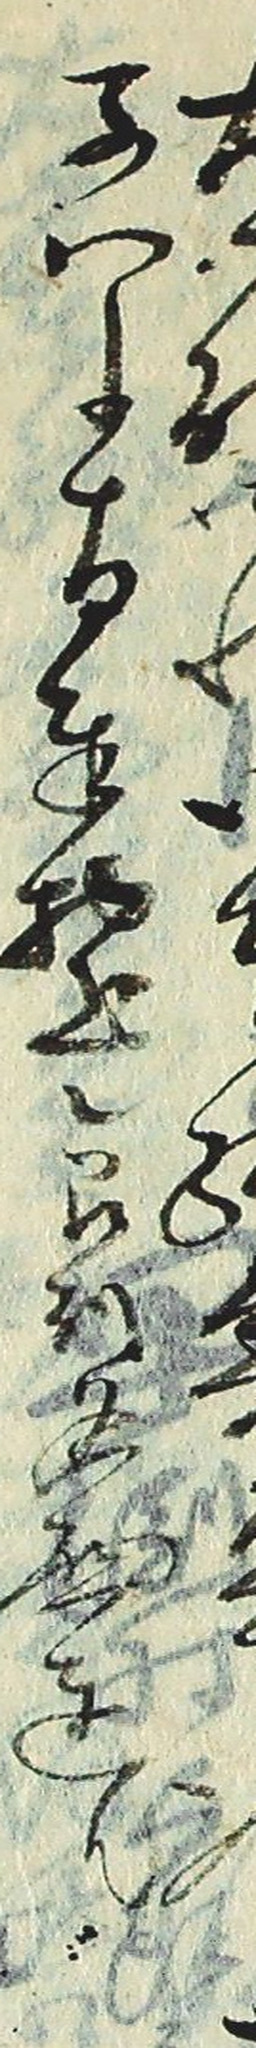子八月十日奉拝上候即刻名西達候
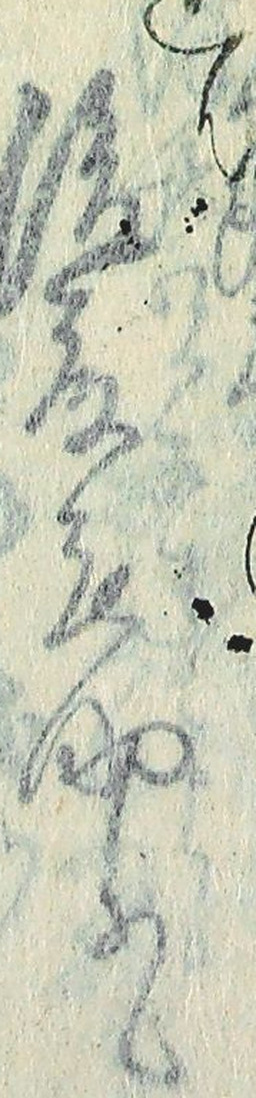後藤庄助方へ

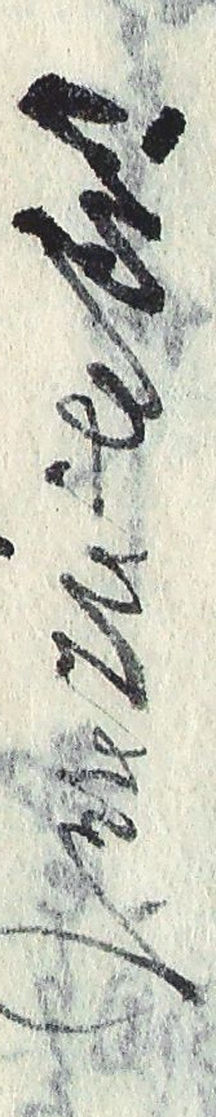八月廿六日
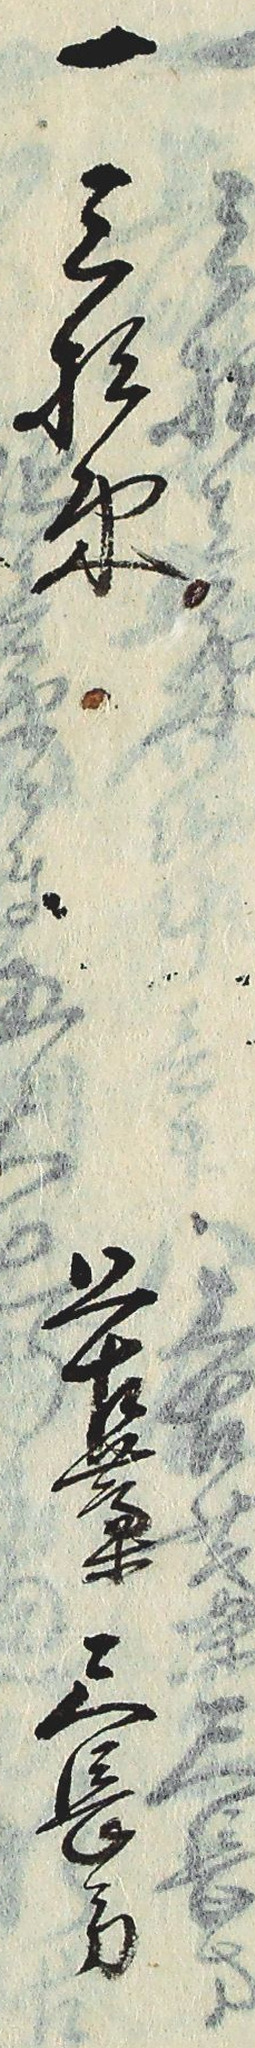一三拾束上古藁尺長方
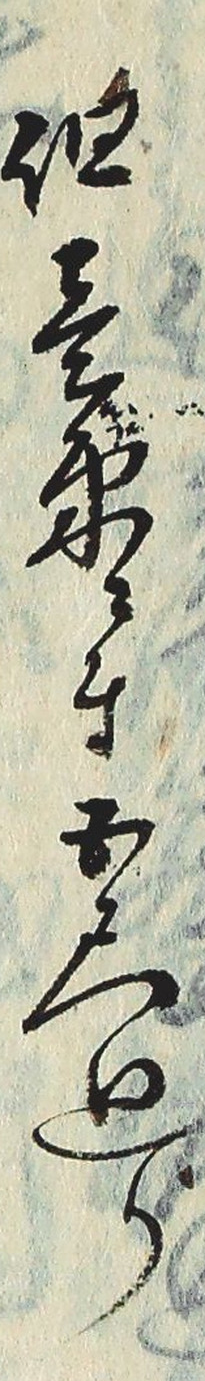但壱束に付五尺廻り
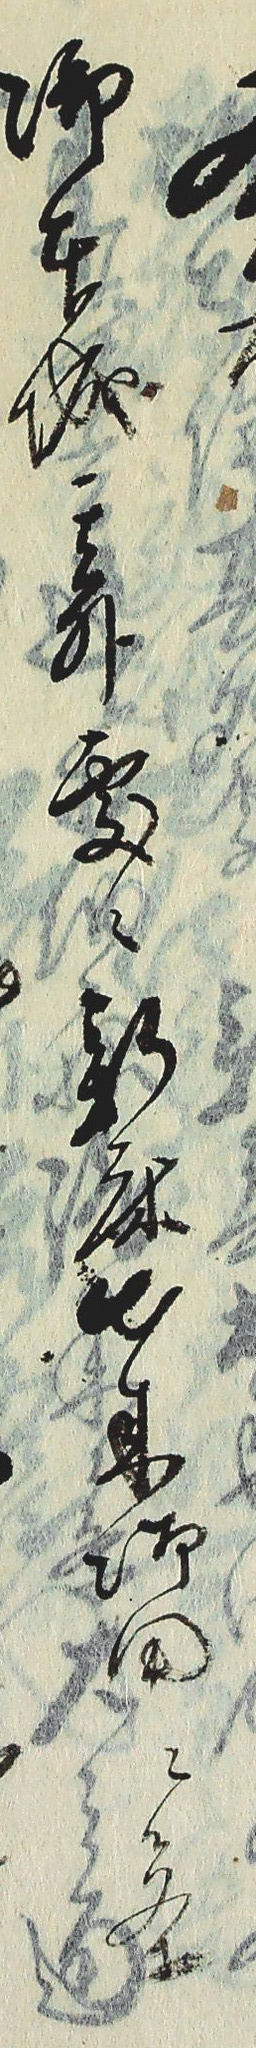御本城其外処々新床出来御用に候条
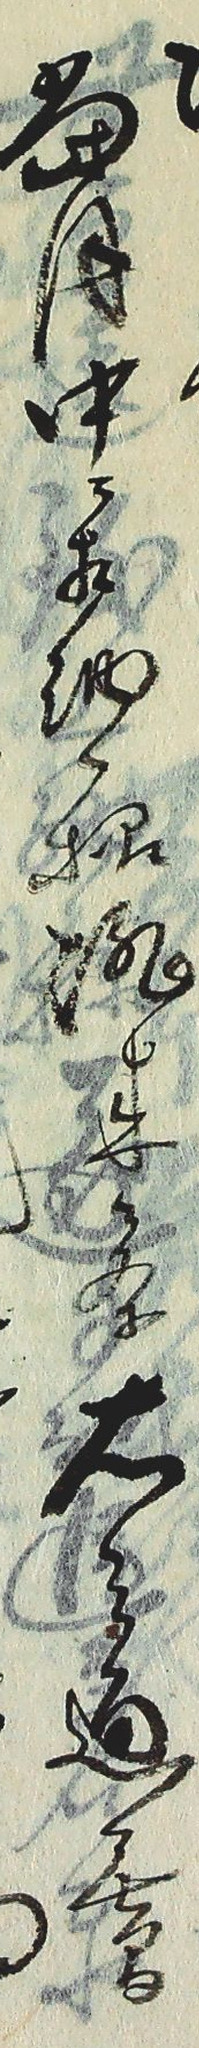当月中に相納候様誂来候条右之通無間
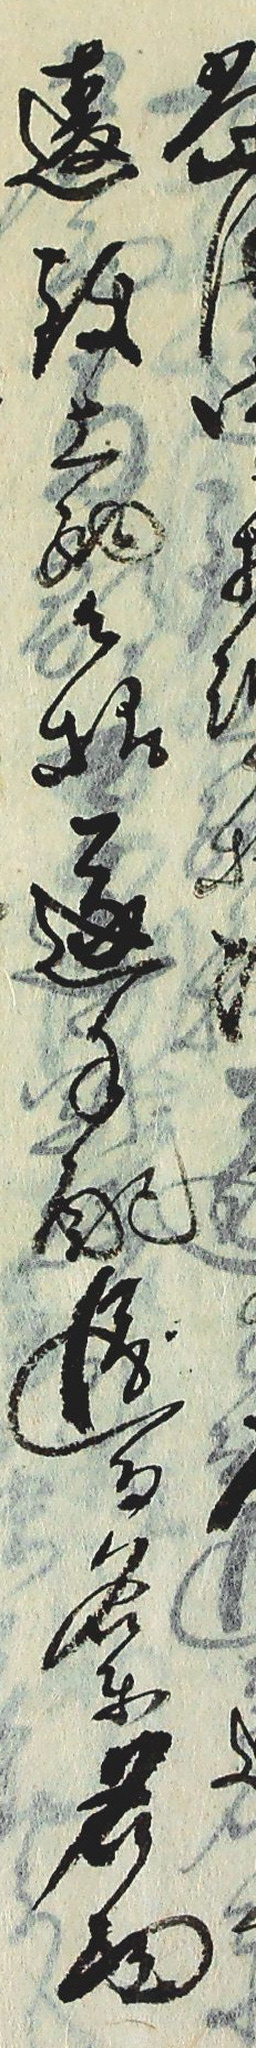違致上納候様遂手配追て名東名西
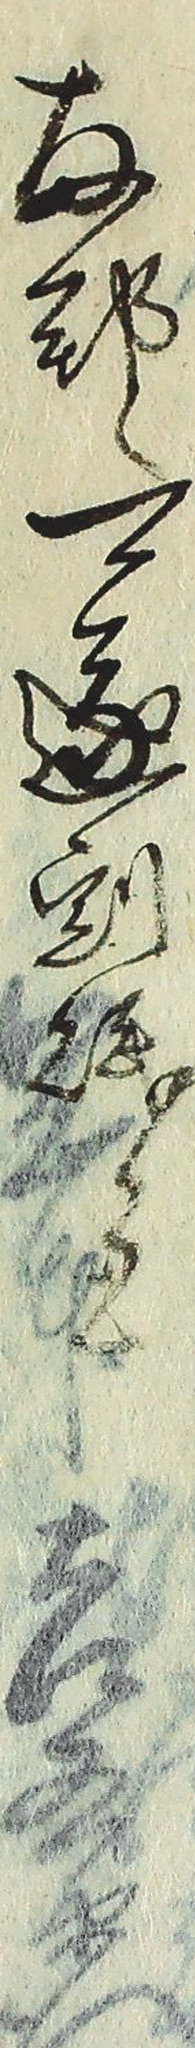両郡へ可遂割賦候以上
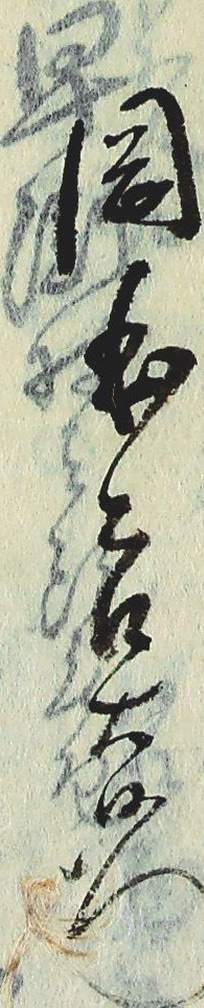岡本吉右衛門
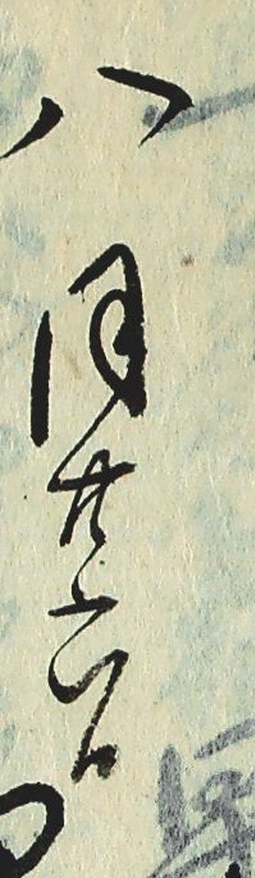八月廿六日
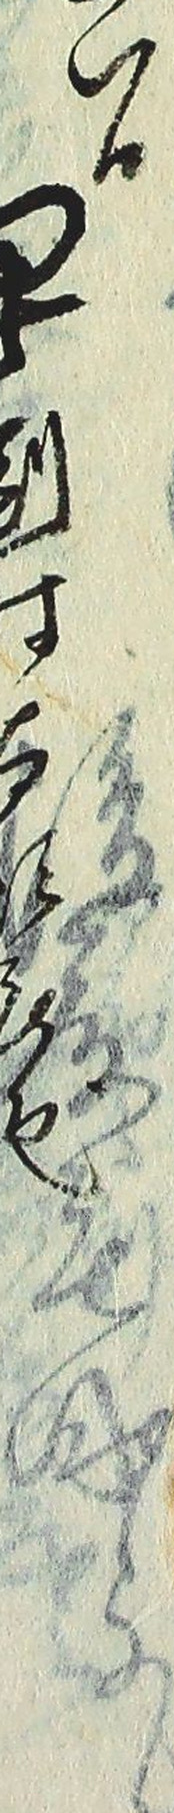早淵村与頭庄屋
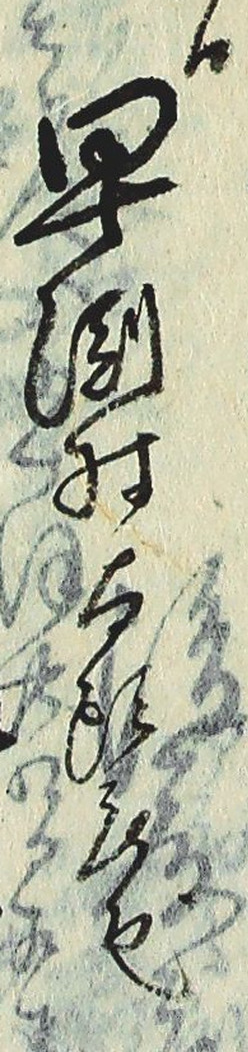早淵村与頭庄屋
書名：名東郡中諸割賦元帳
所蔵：鳴門教育大学 Naruto University of Education
